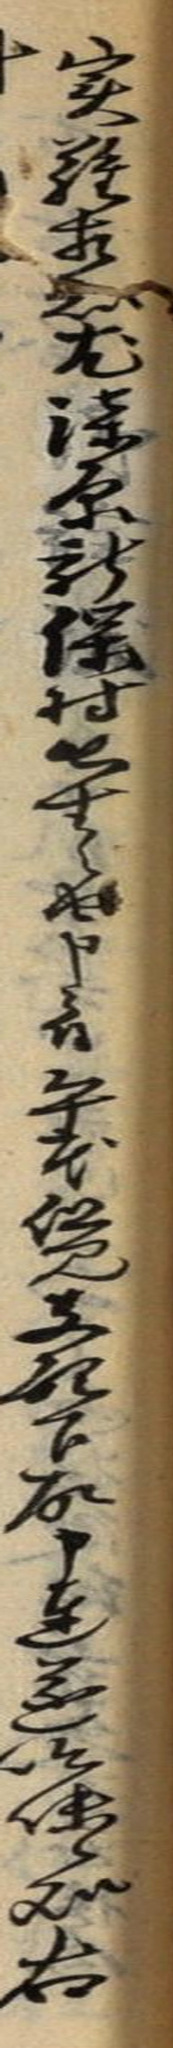実難相知尤漆原新保村出生之由申に付平本但見支配下故申達遂吟味候処右
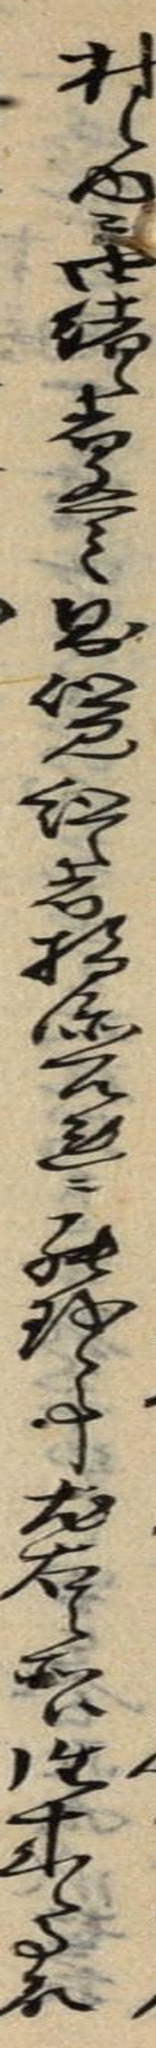村之内に由緒之者有之則但見組之者指添召連に罷越候事尤右之所は往来之事故
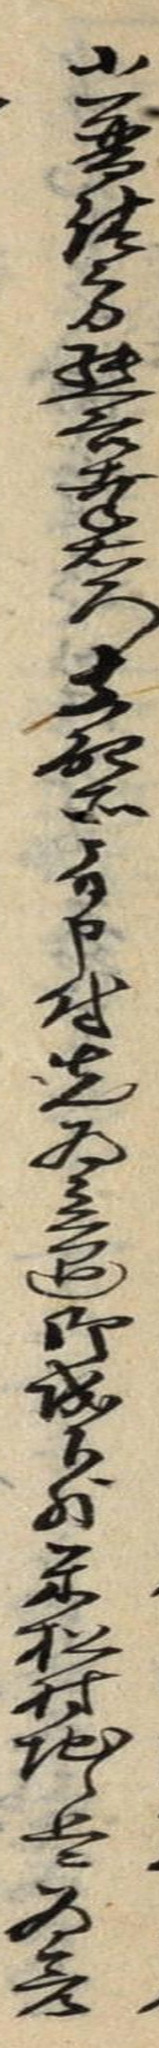小普請方熊谷幸右衛門支配所に付申付先為立退御城下外米松村地之上に為差
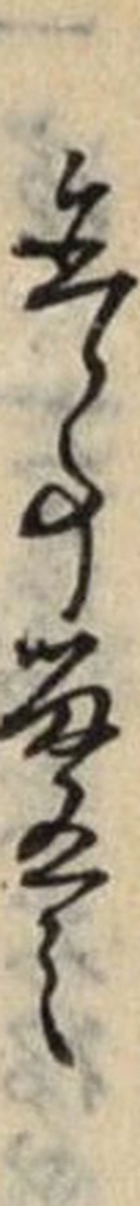置候事留有之
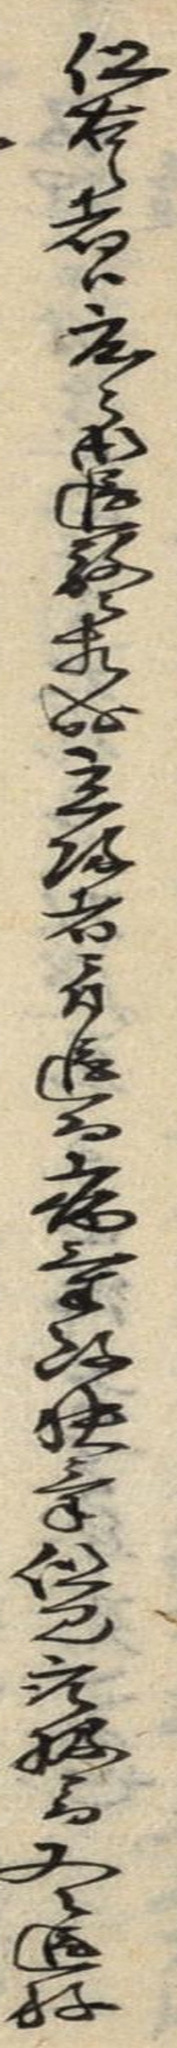但右之者は度々御追放に相成立帰者に付追て病気致快気但見取扱にて又々追放
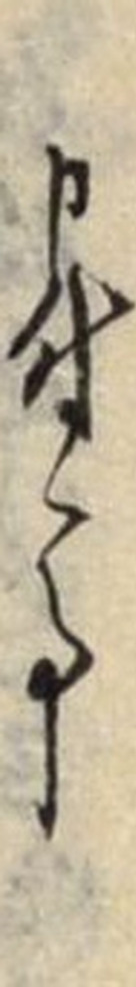申付候事
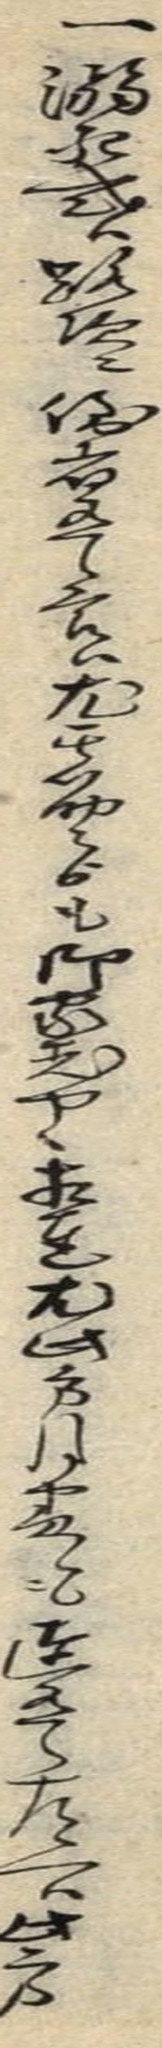一溺死或は路次に倒者有之節は尤其筋々ゟも御家老中へ相達尤此方月番へも達有之左候へは此方
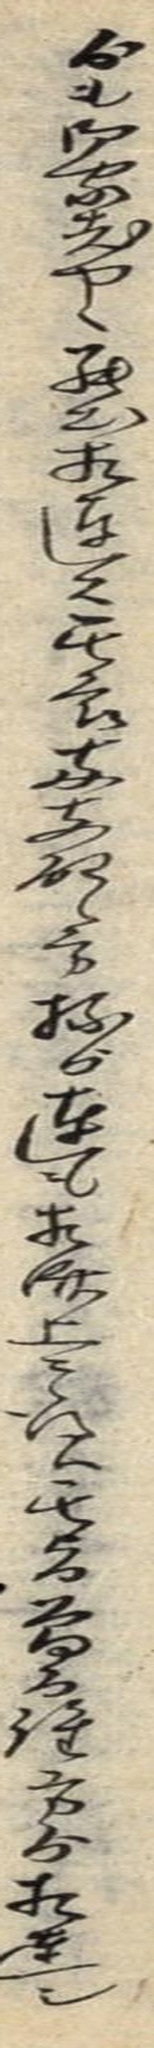ゟも御家老中へ罷出相達ス其節両支配之方抔ゟ達も相済上に候得は其旨曽て誰方ゟ相達シ
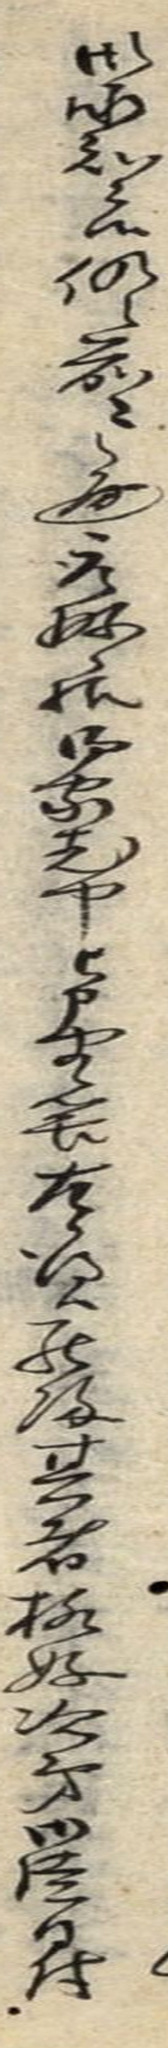御承知に候仍之前々之通取扱候様御家老中被申聞候筈左候得は罷帰其者格好次第御徒目付
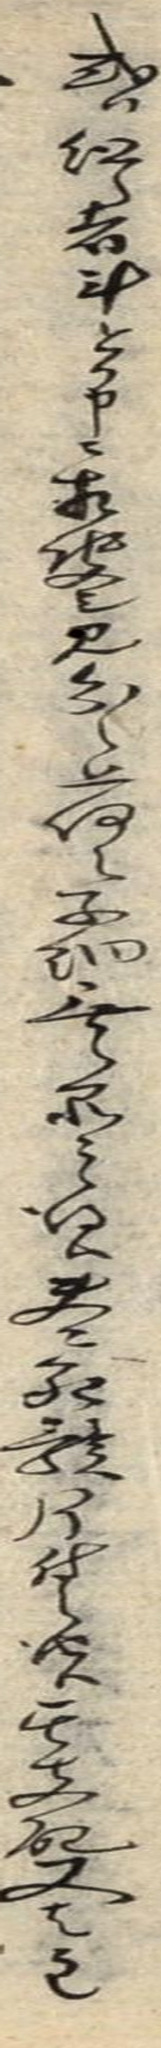或は組之者斗とか申に相決シ見分之上何之子細無之品に候得は夫々死骸片付之儀は其支配又は主
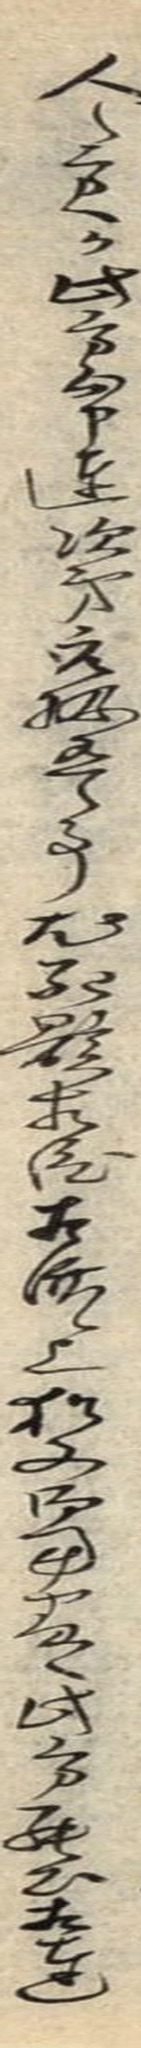人之方へか此方ゟ申達次第取扱有之事尤死骸相渡相済候上猶又御用番へ此方罷出相達
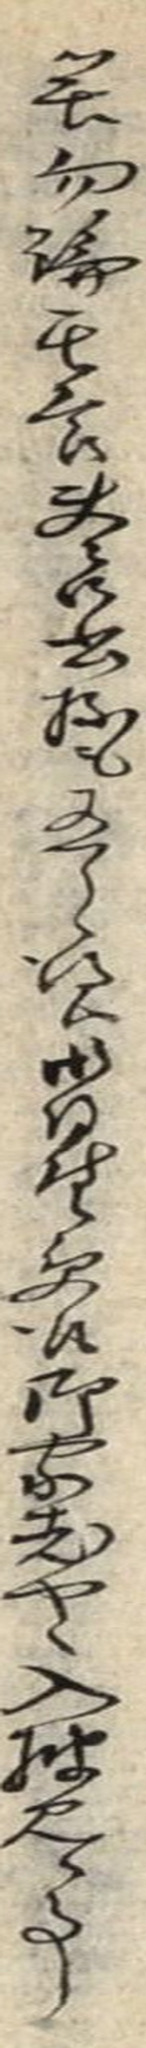筈勿論其節夫々口書抔も有之候得は御目付へ受取御家老中へ入披見候事
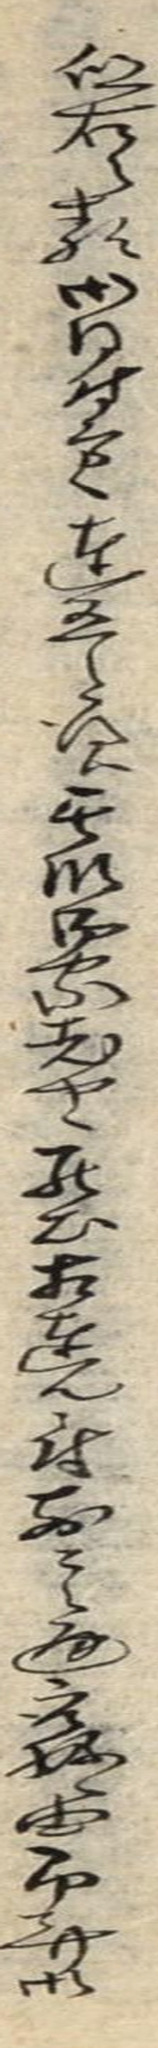但右之類御目付方へ達有之候得は其段御家老中へ罷出相達ルに付前々之通取扱候由即刻御
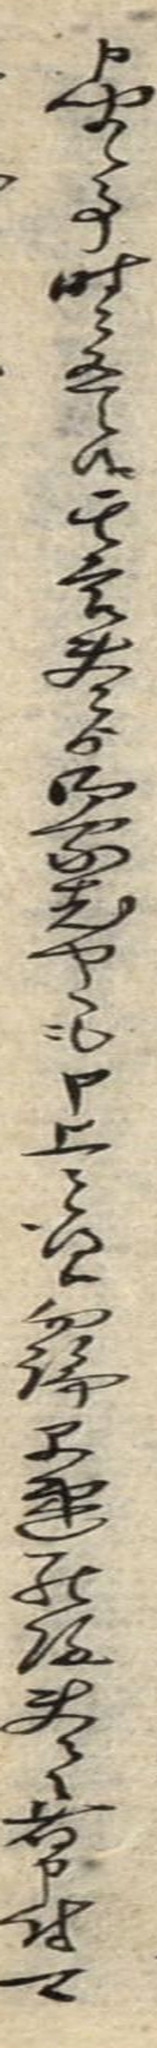申聞候事時々有之候其節夫々ゟ御家老中へも申上に候得は勿論早速罷帰夫々之者申付可
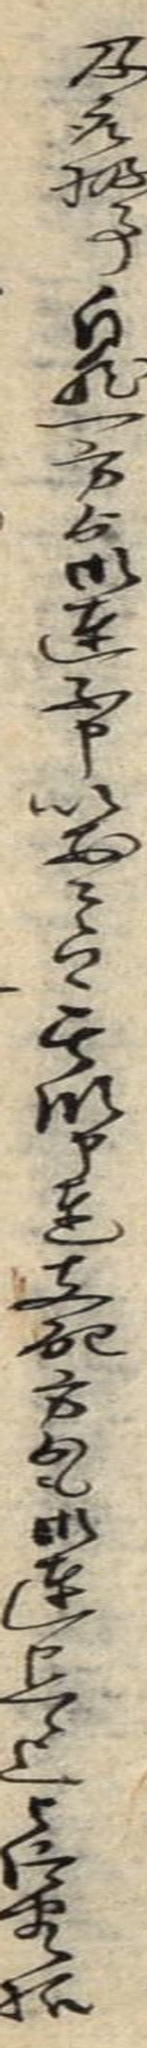及取扱事自然一方ゟ御達不申以前に候はゝ其段申達支配方ゟも御達申上候上被仰聞候様
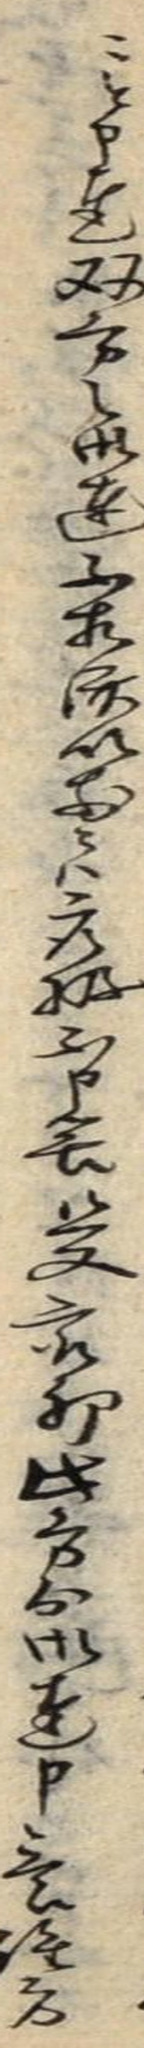にと申達双方之御達不相済以前には取扱不申筈且又最初此方ゟ御達申候節誰方
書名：御停止異変死失
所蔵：福井県文書館 Fukui Prefectural Archives
